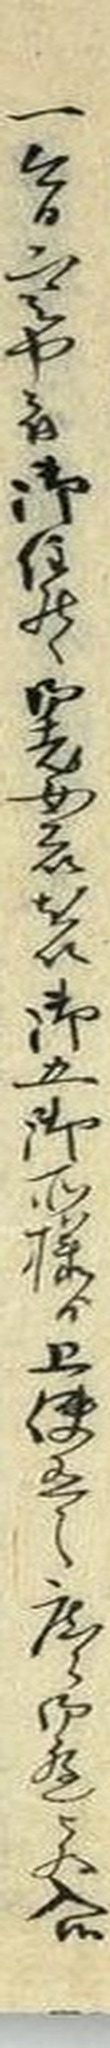一今日寒中ニ付御住居へ御老女衆を以御五御所様ゟ上使有之度々御逢被為入候
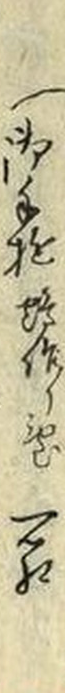御手遊鶴作り台一箱
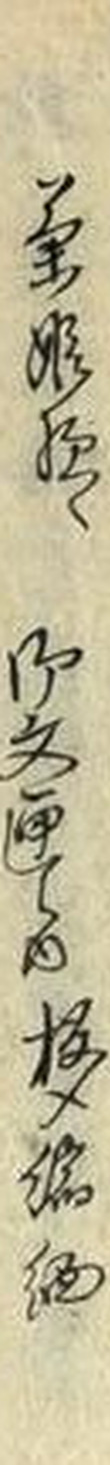菊姫様へ御文匣之内板〆縮緬
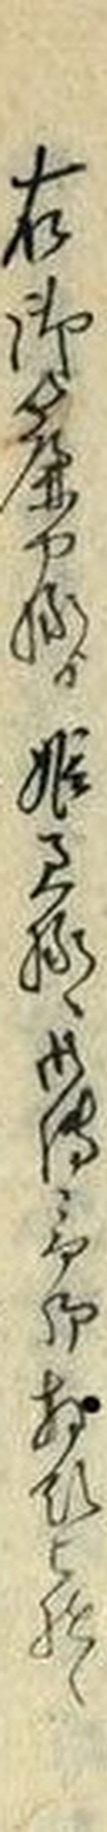右御簾中様ゟ姫君様へ御伝ニ而御拝領被遊
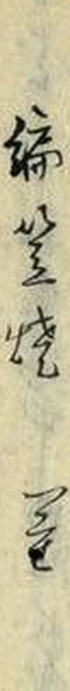編笠焼一重
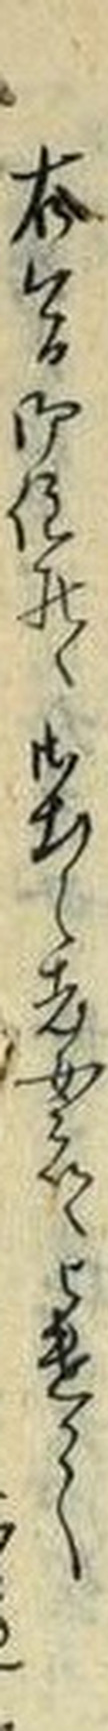右今日御住居へ御出候老女衆へ被遣之

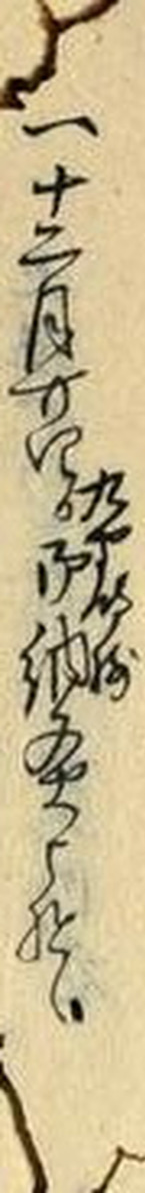一十二月廿四日九半時揃御納灸被遊候
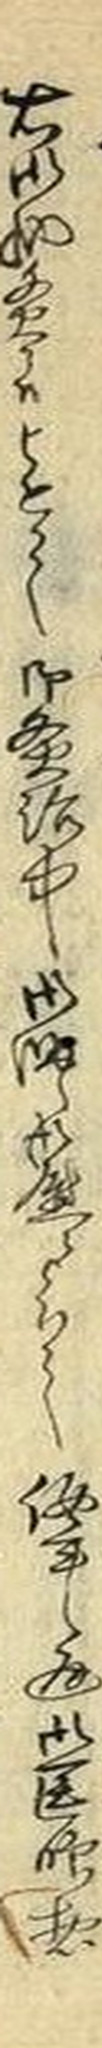右御納灸ニ付被進之御灸治中御側之御慰ニ被下之例年之通御医師惣
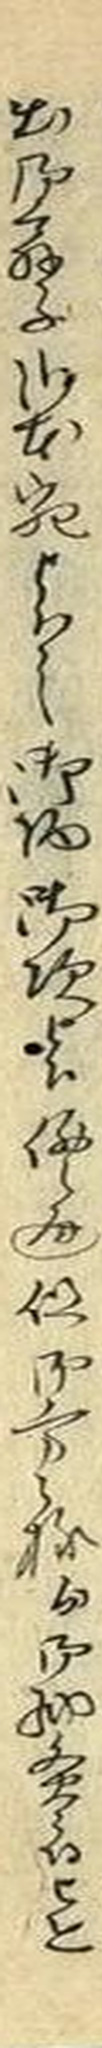出御扇子弐本宛被下之御酒御次被下例之通但御方々様ゟ御納灸ニ付被進
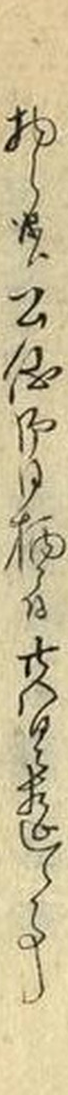物之儀ハ公儀御日柄ニ付廿八日ニ相廻候事
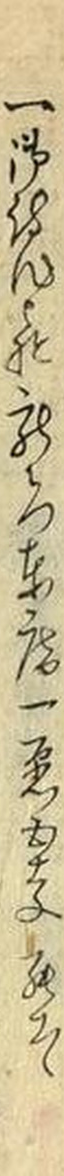一御詩作被遊新右衛門東庵一応五太夫罷出候
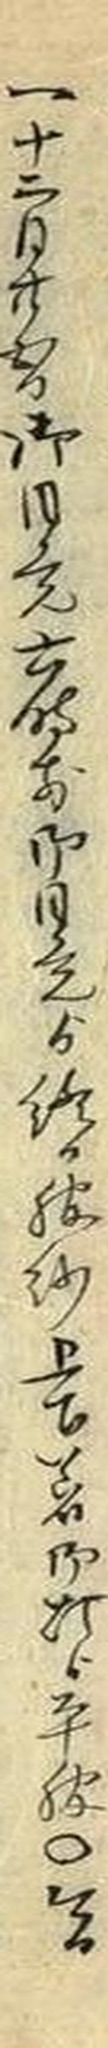一十二月廿五日御目覚六時前御目覚ゟ終日服紗上下着御灯ゟ平服〇今日
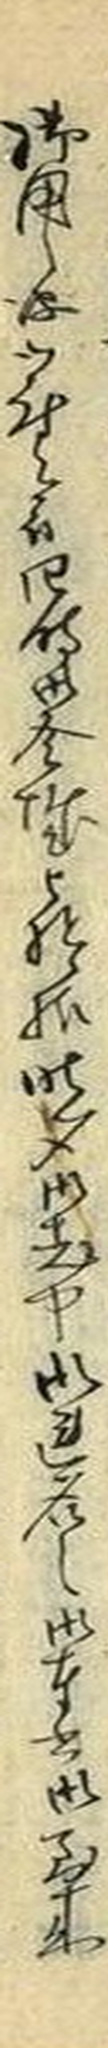御用之儀御座候ニ付四時御登城被遊候様昨夕御老中御連名之御奉書御到来
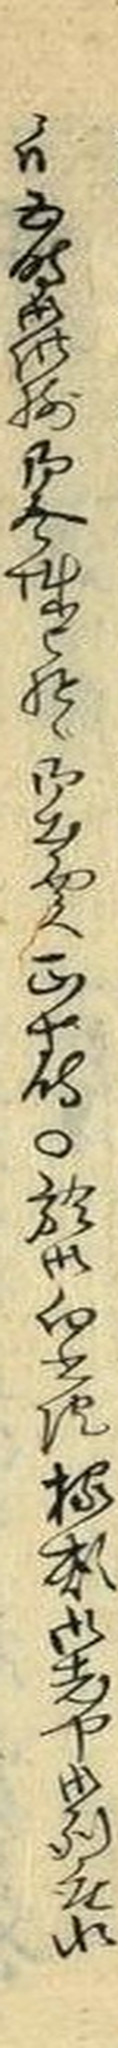ニ付五時御供揃御登城被遊候御出殿正半時〇於御白書院縁頬御老中御列座水
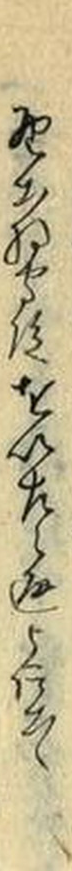野出羽守殿を以左之通被仰出候
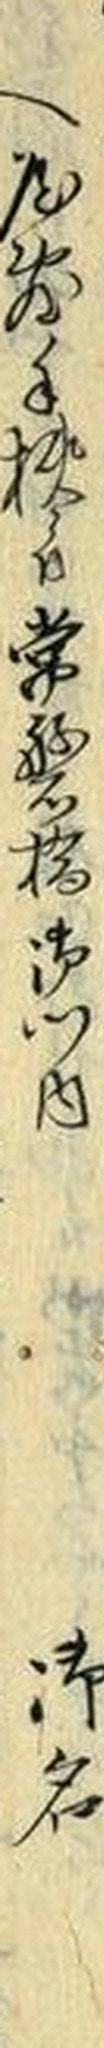屋敷手狭ニ付常盤橋御門内御名
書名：少傅日録抄（斉承付側向頭取日記、在府）
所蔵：福井県文書館 Fukui Prefectural Archives
